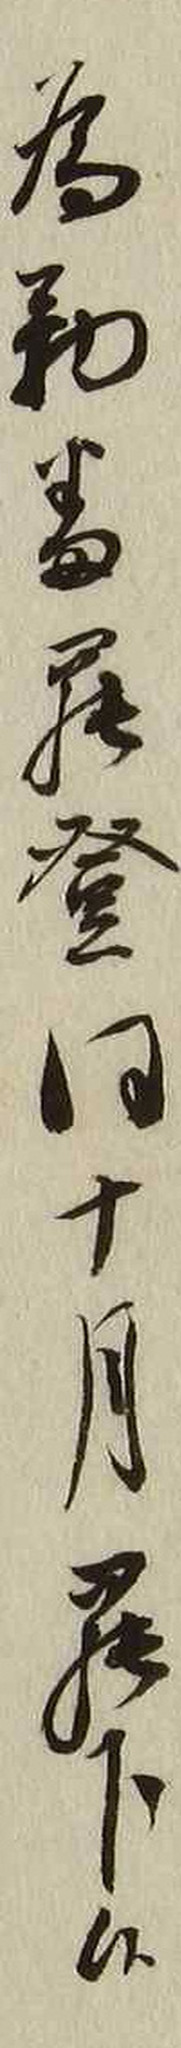為勤番罷登同十月罷下候
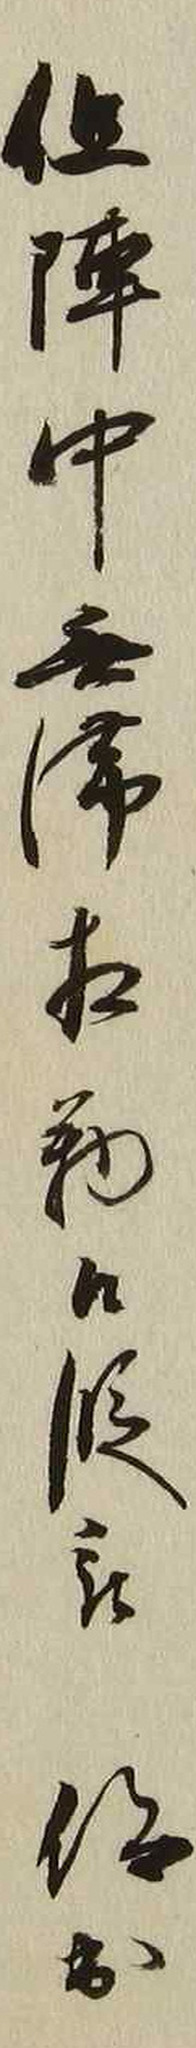但陣中無滞相勤候段被仰出
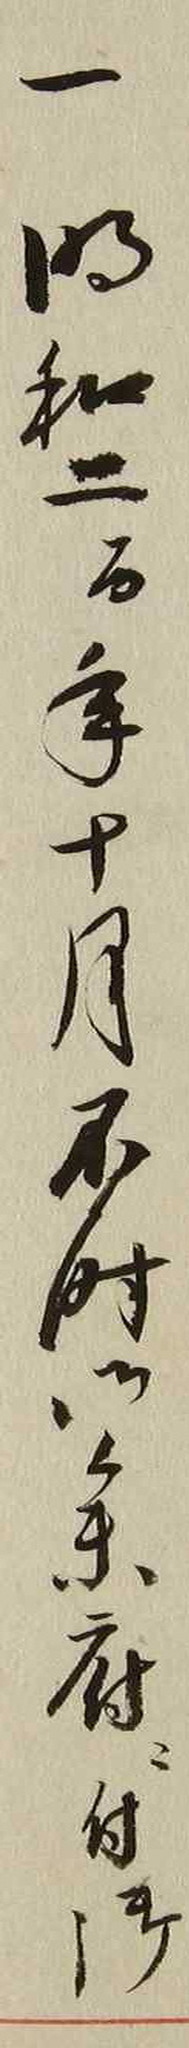一明和二酉年十月不時御参府ニ付御
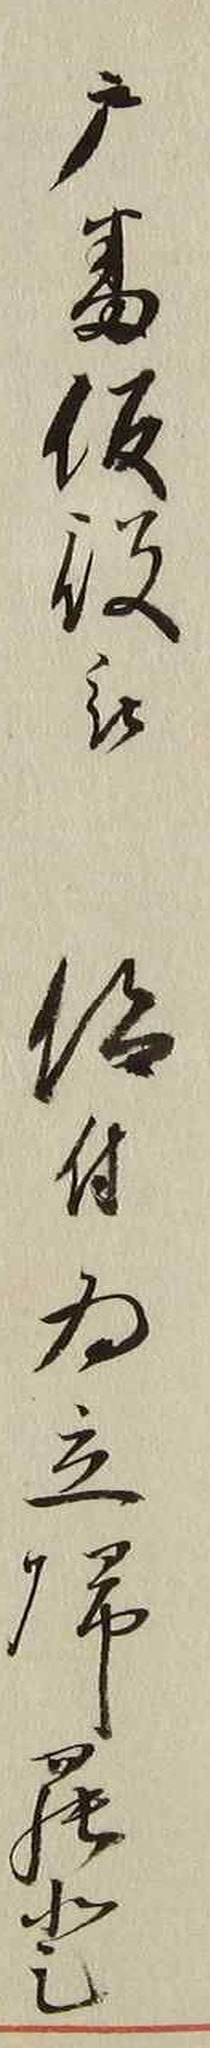戸番仮役被仰付為立帰罷登
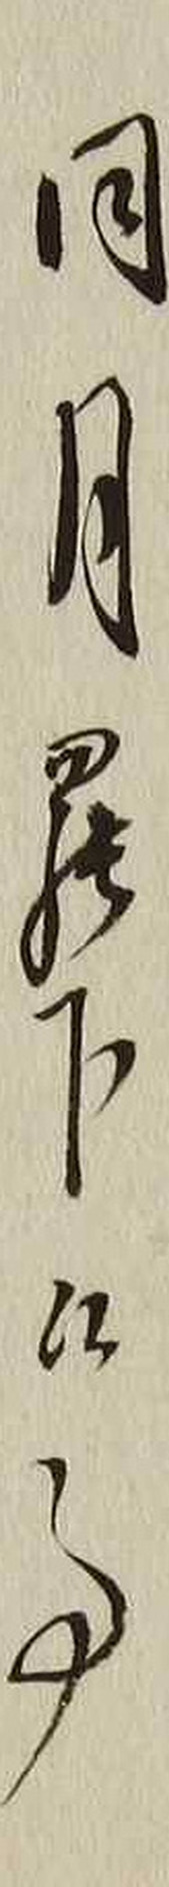同月罷下候事
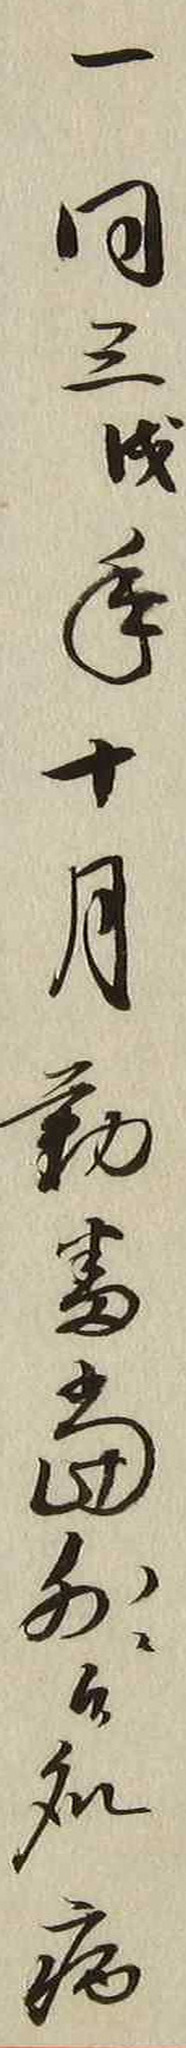一同三戌年十月勤番当外ニ候処病
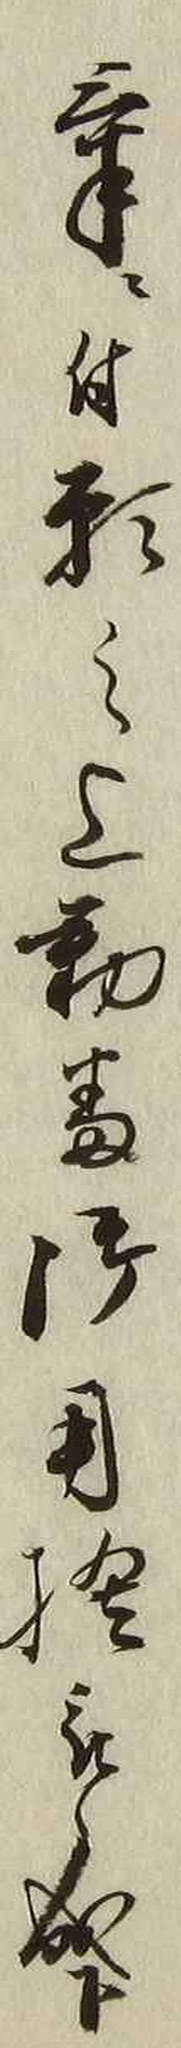気ニ付願之上勤番御用捨被成下
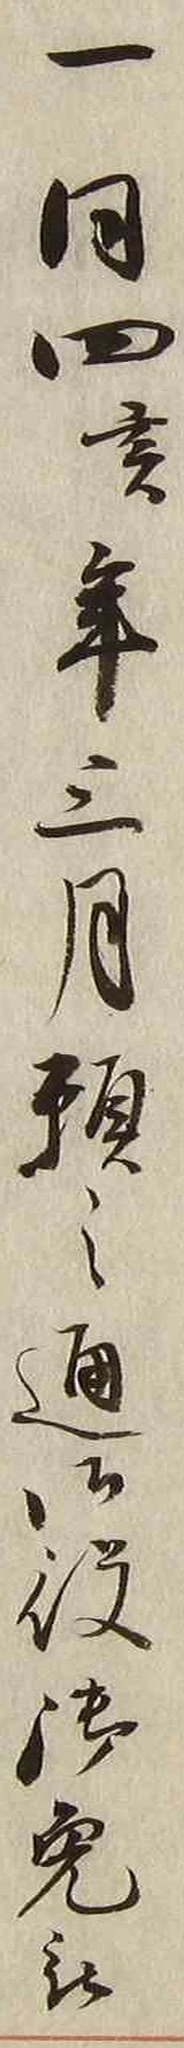一同四亥年三月願之通御役御免被
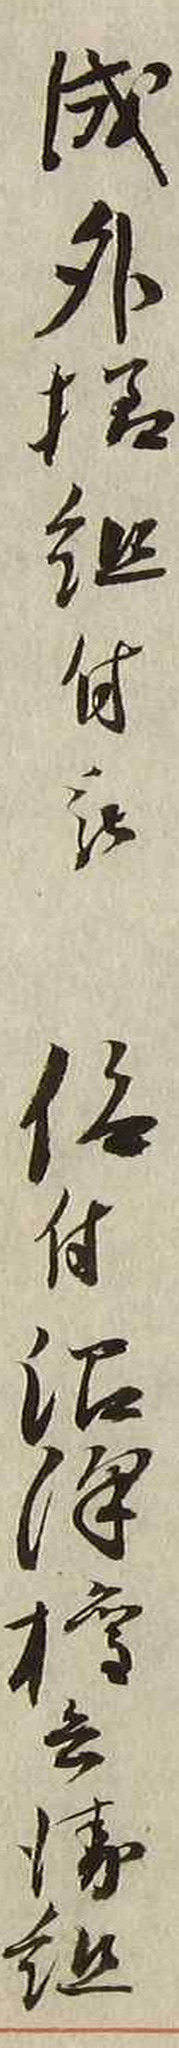成外様組付被仰付沼沢権兵衛組
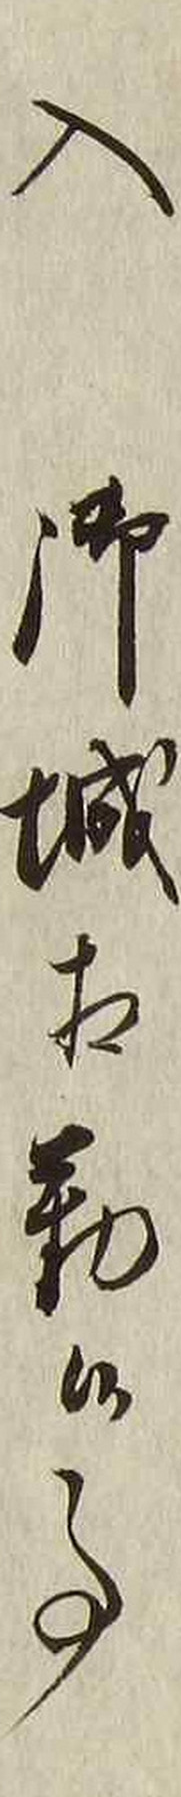入御城相勤候事
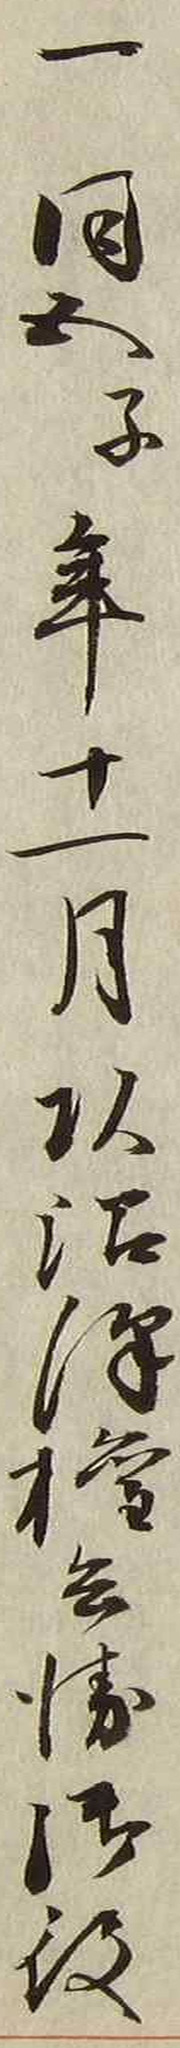一同五子年十一月頭沼沢権兵衛御役
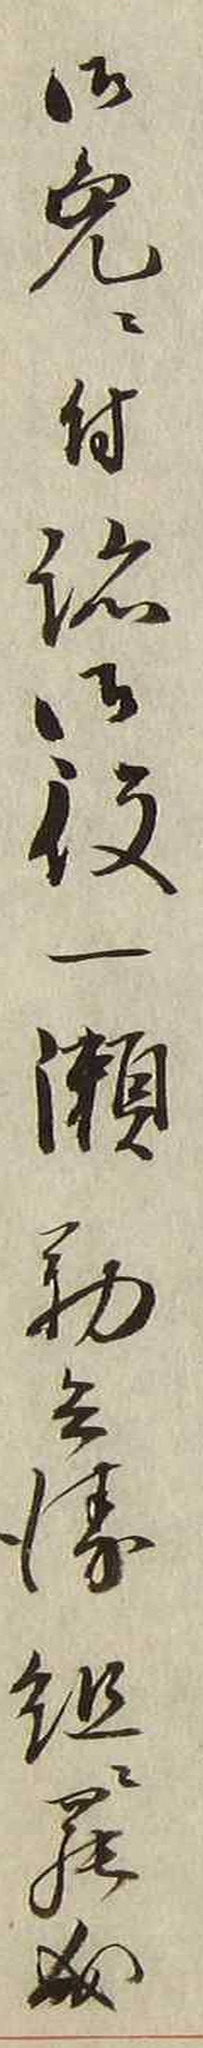御免ニ付跡御役一瀬勘兵衛組ニ罷成

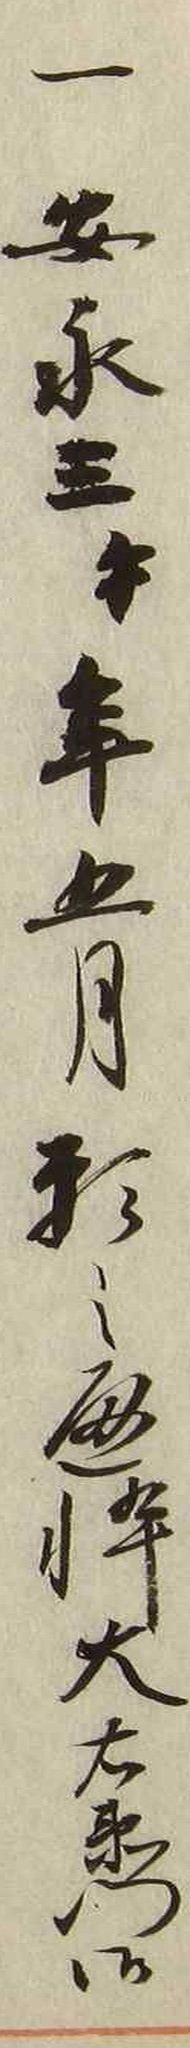一安永三午年五月願之通忰大右衛門御
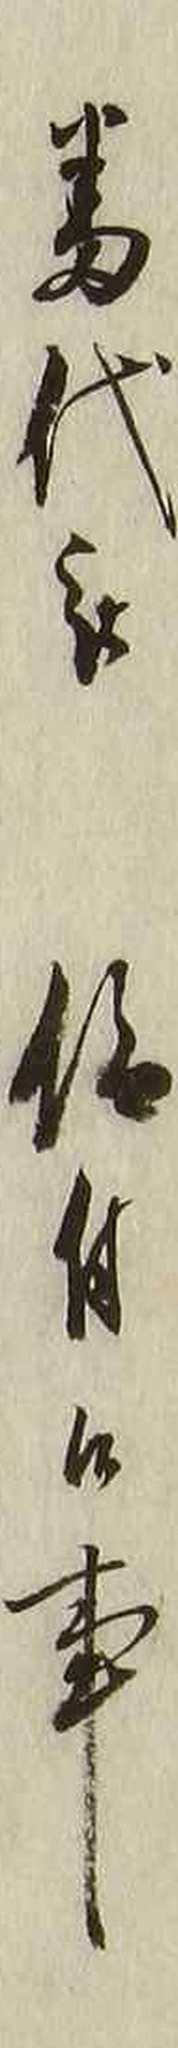番代被仰付候事
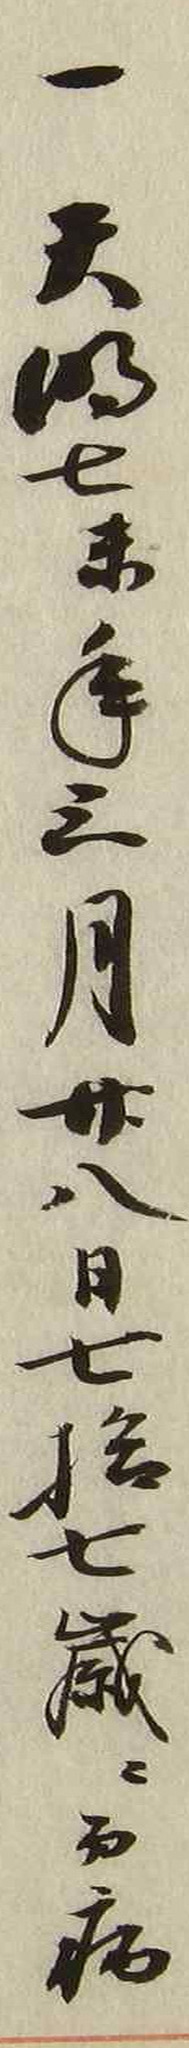一天明七未年三月廿八日七拾七歳ニ而病
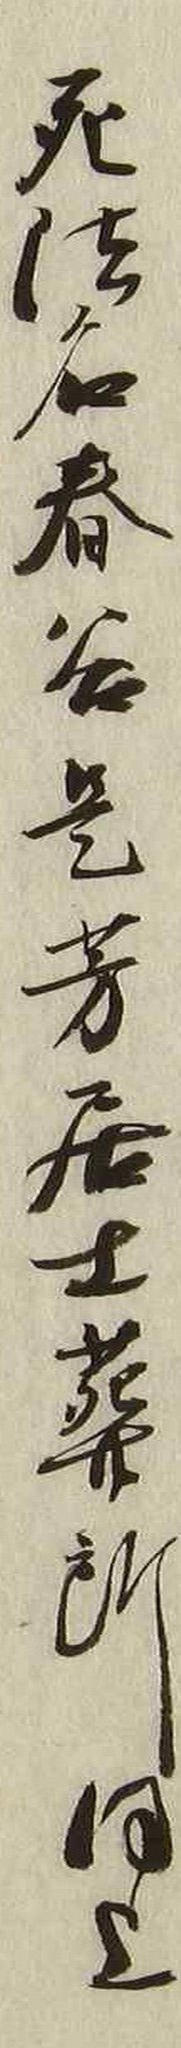死法名春谷是芳居士葬所同上
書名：諸士系譜　巻之22　い之部22
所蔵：会津若松市立会津図書館
